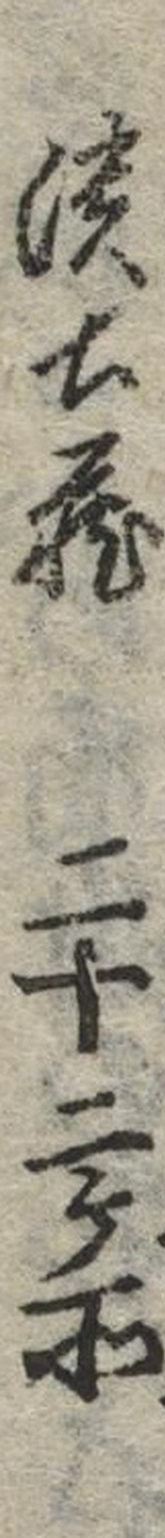潰土蔵二十二ケ所
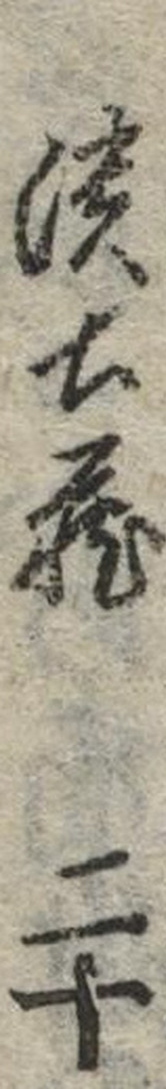潰土蔵無之
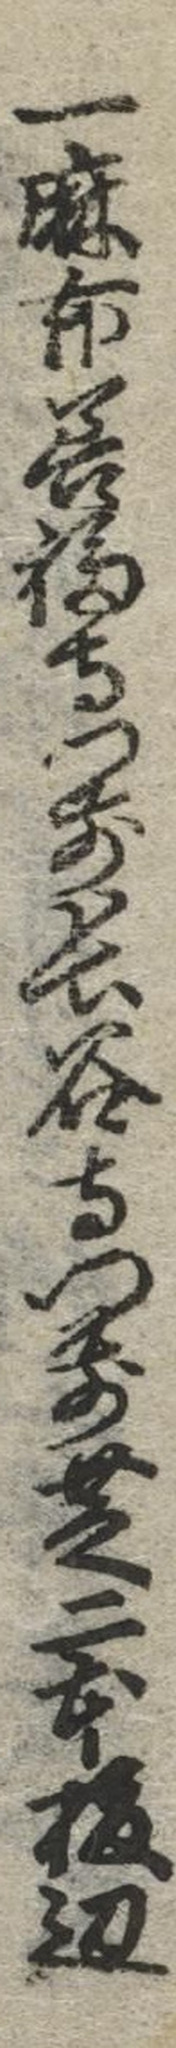一麻布善福寺門前長谷寺門前芝二本榎辺
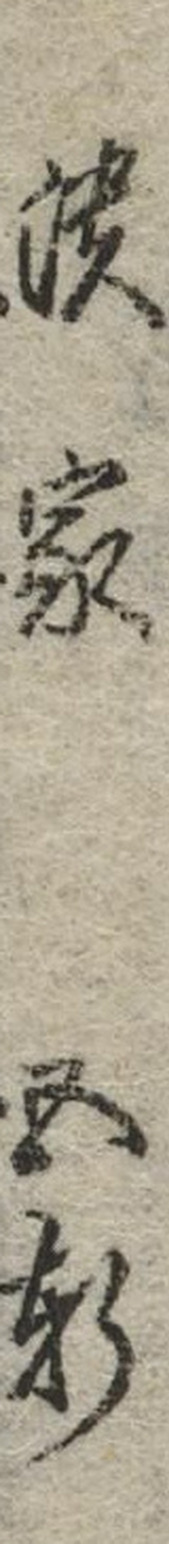潰家五軒
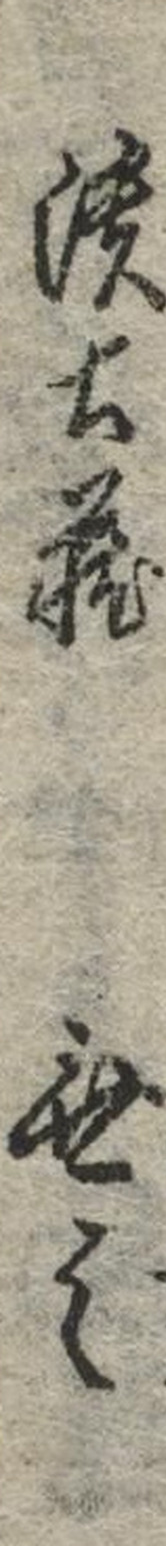潰土蔵無之
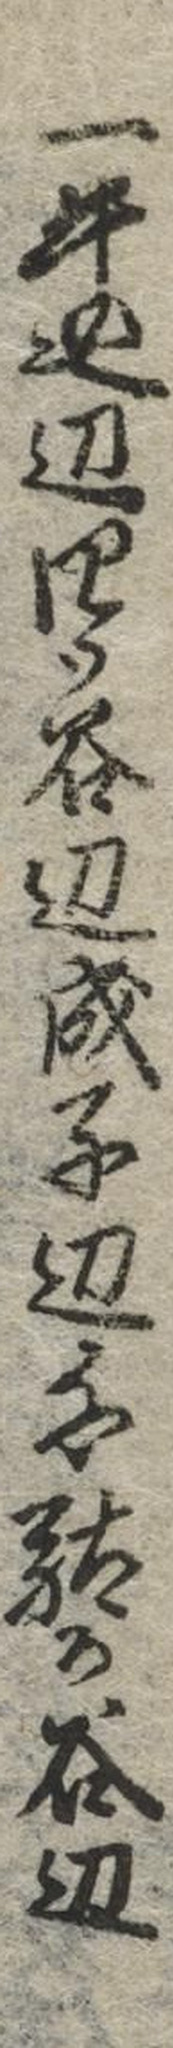一牛込辺四ツ谷辺成子辺千駄ケ谷辺
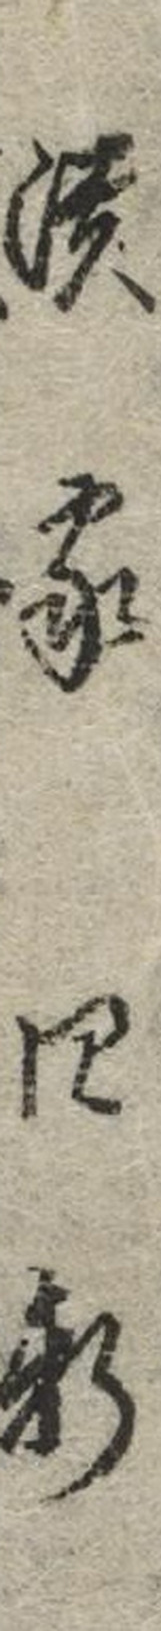潰家四軒
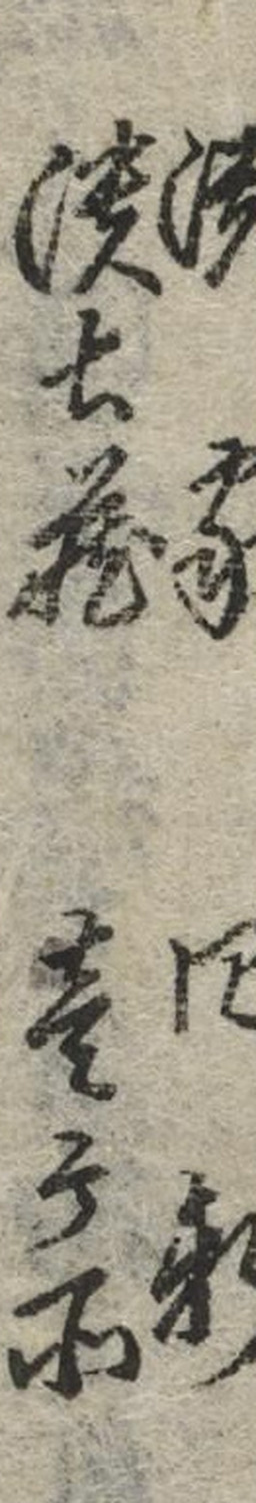潰土蔵壱ケ所
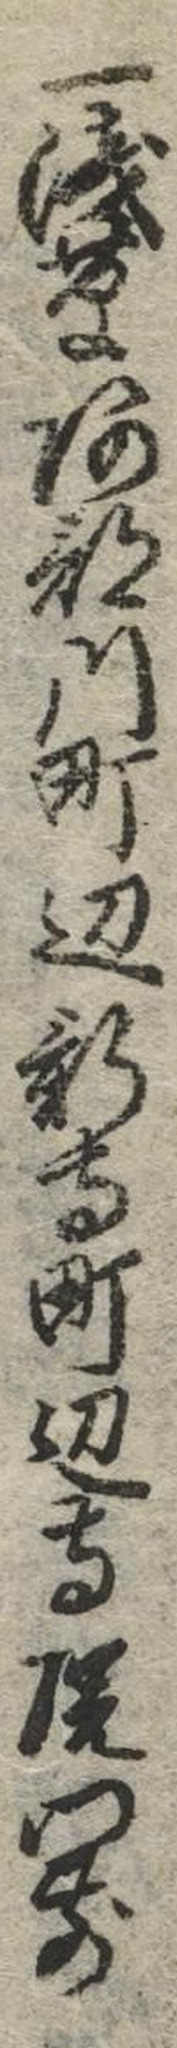一浅草阿部川町辺新寺町辺寺院門前
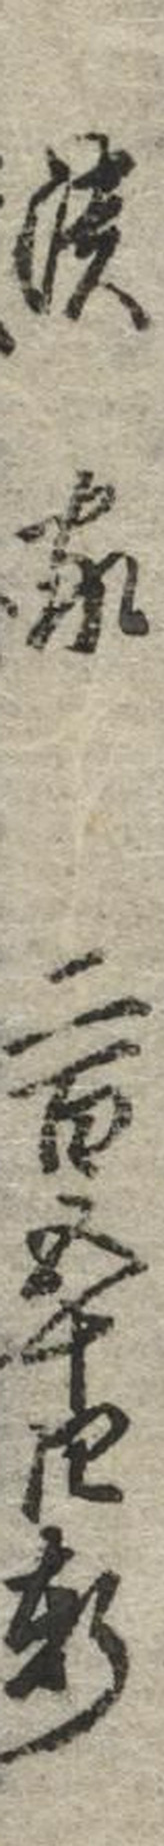潰家二百五十四軒
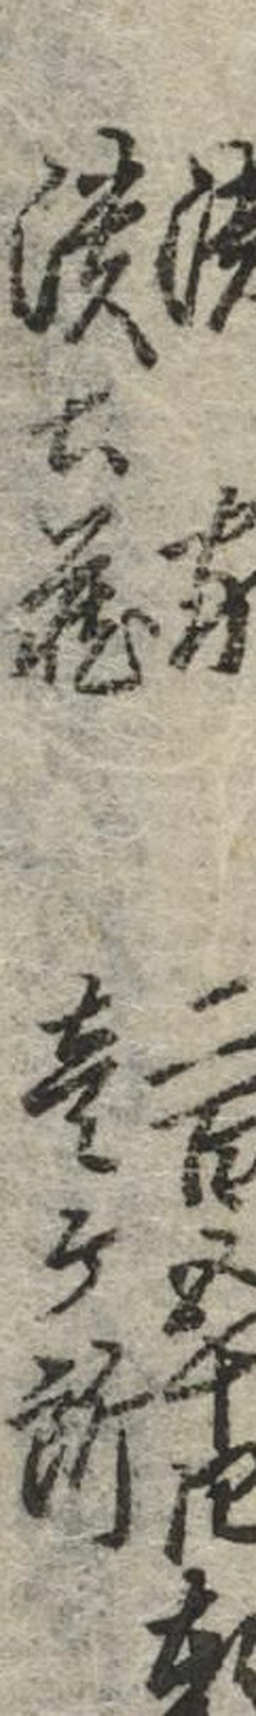潰土蔵壱ケ所
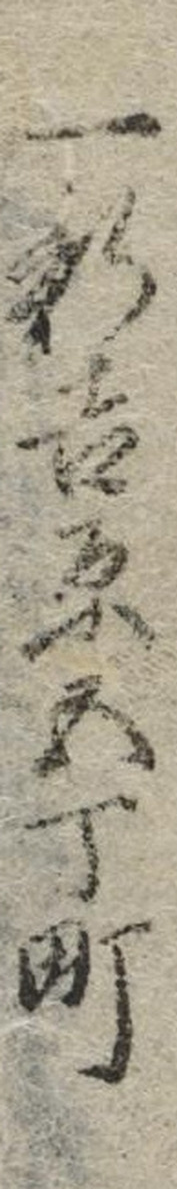一新吉原五丁町
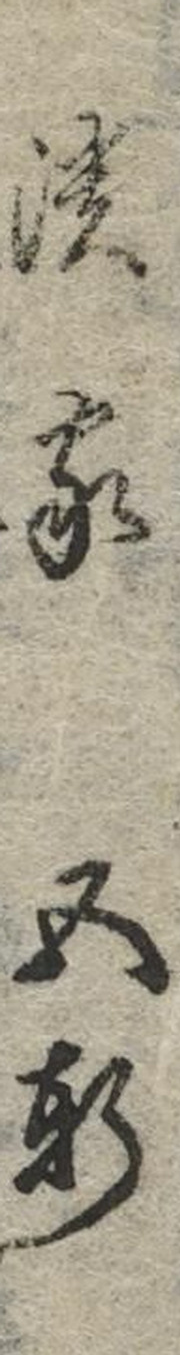潰家五軒
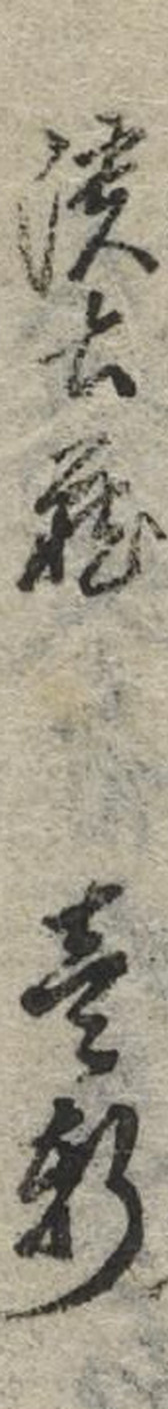潰土蔵壱軒
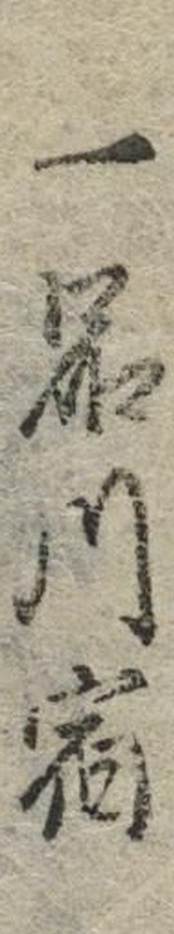一品川宿
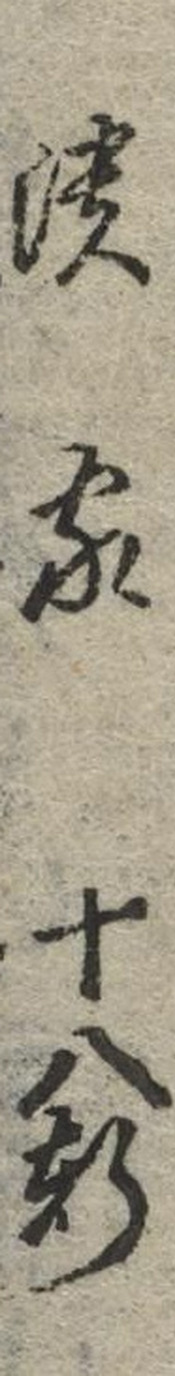潰家十八軒
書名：江戸御屋鋪方町方共　地震類焼場所巨細書之寫　潰家潰土蔵共取調附街道筋近在迄
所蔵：東京大学地震研究所図書室 Earthquake Research Institute Library, The University of Tokyo, JAPAN
